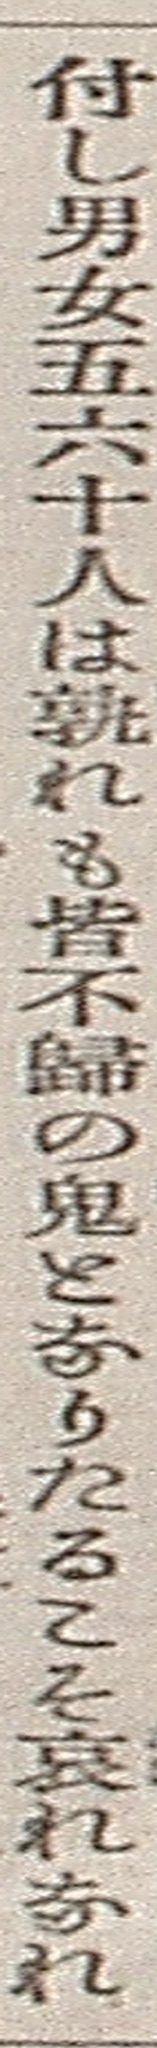付し男女五六十人は孰れも皆不帰の鬼となりたるこそ哀れなれ
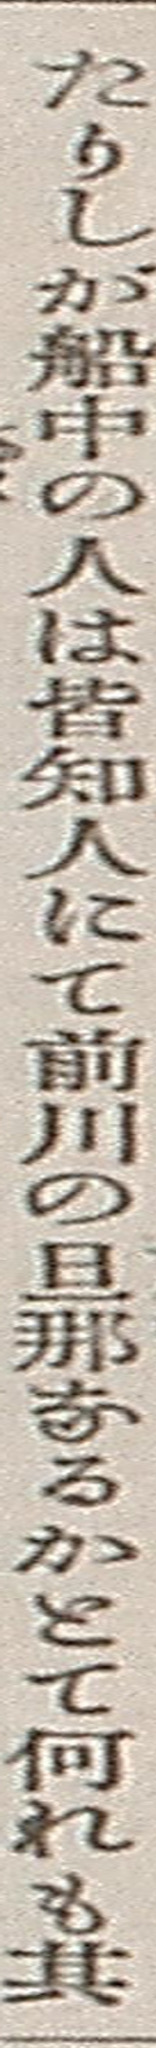たりしが船中の人は皆知人にて前川の旦那なるかとて何れも其
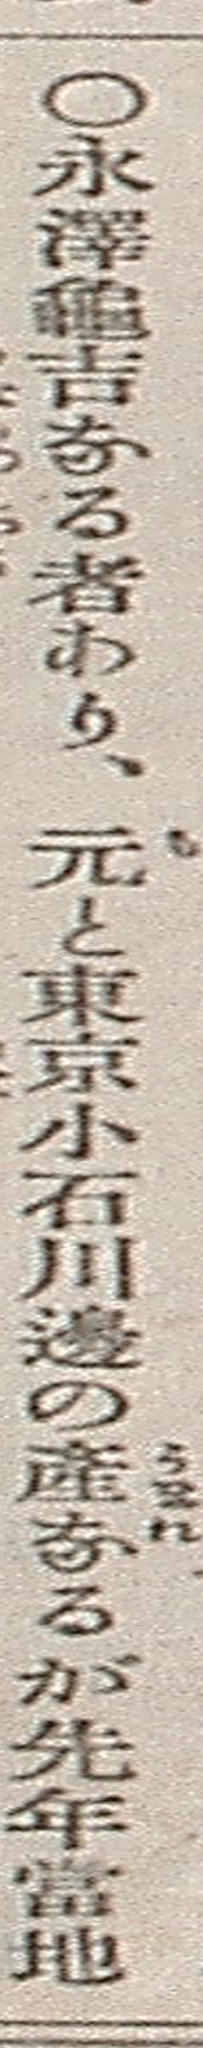○永沢亀吉なる者あり、元と東京小石川辺の産なるが先年当地
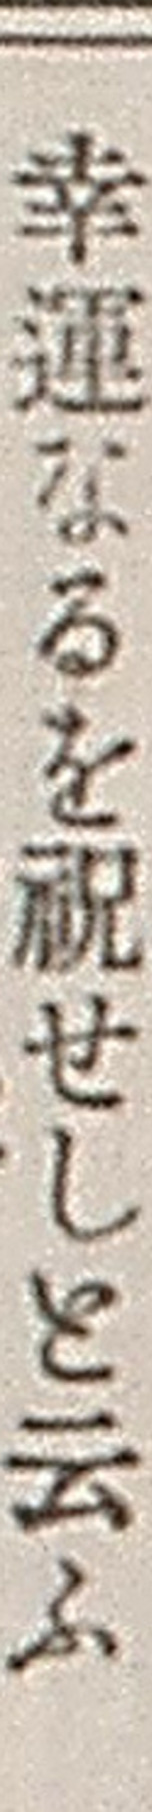幸運なるを祝せしと云ふ
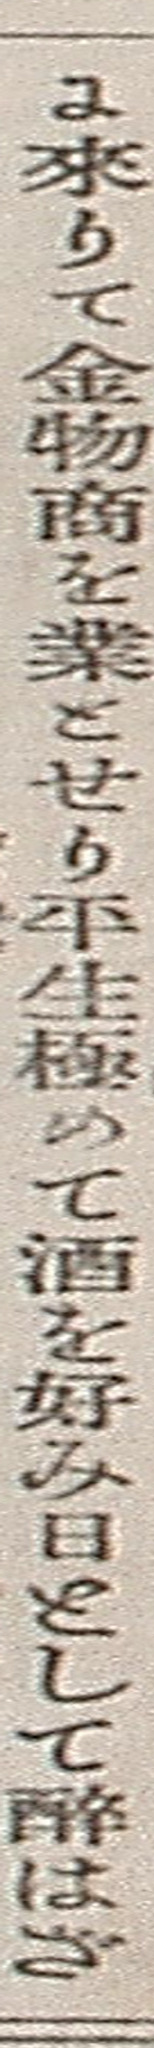に来りて金物商を業とせり平生極めて酒を好み日として酔はざ
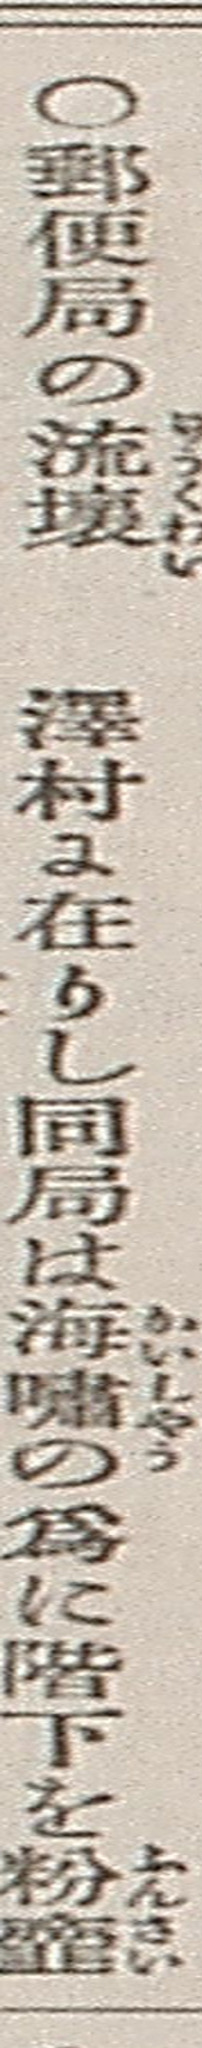○郵便局の流壊沢村に在りし同局は海嘯の為に階下を粉韲
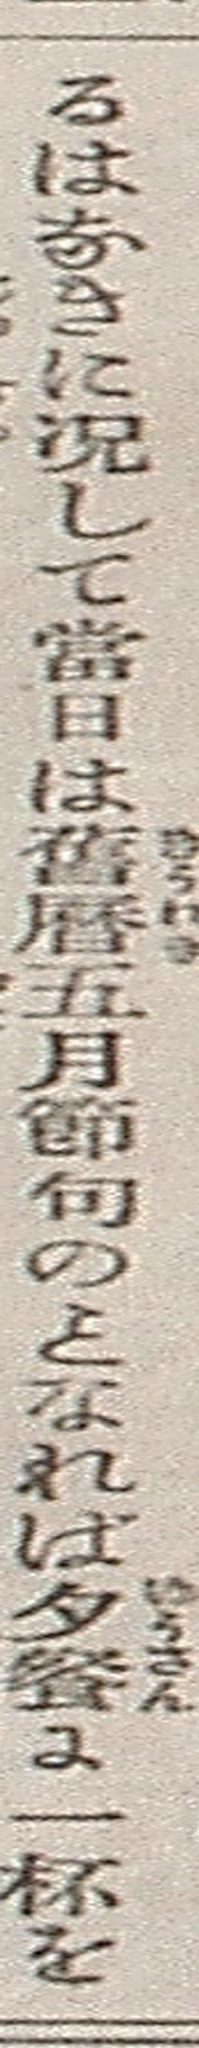るはなきに况して当日は旧暦五月節句のことなれば夕餐に一杯を
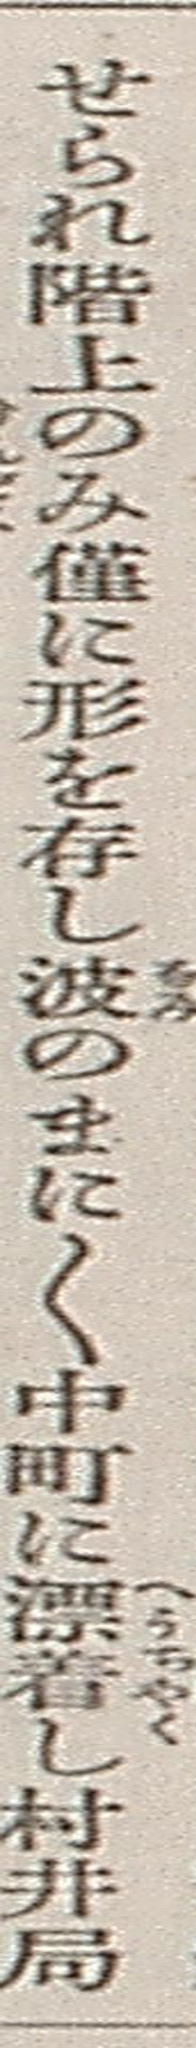せられ階上のみ僅に形を存し波のまに〳〵中町に漂着し村井局
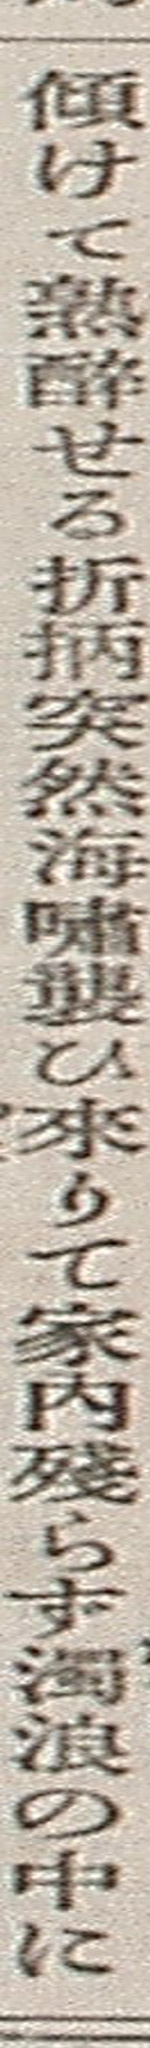傾けて熟酔せる折柄突然海嘯襲ひ来りて家内残らず濁浪の中に
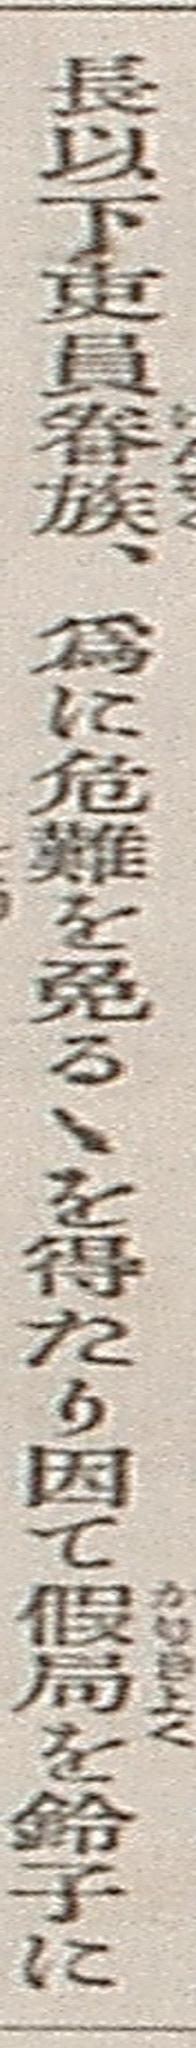長以下吏員眷族、為に危難を免るゝを得たり因て仮局を鈴子に
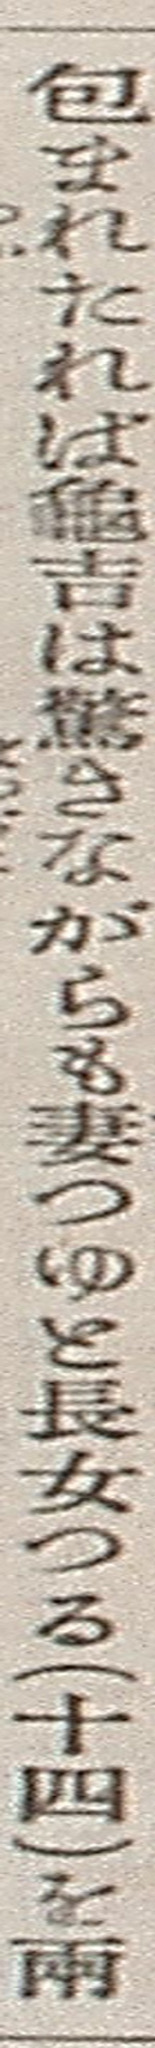包まれたれば亀吉は驚きながらも妻つゆと長女つるを両
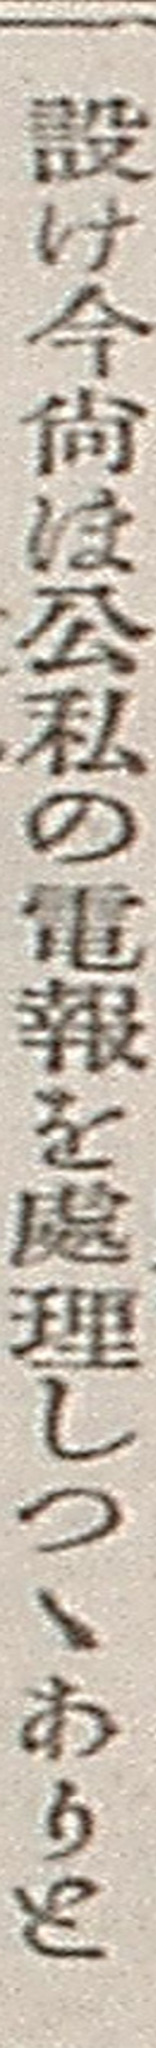設け今尚ほ公私の電報を処理しつゝありと
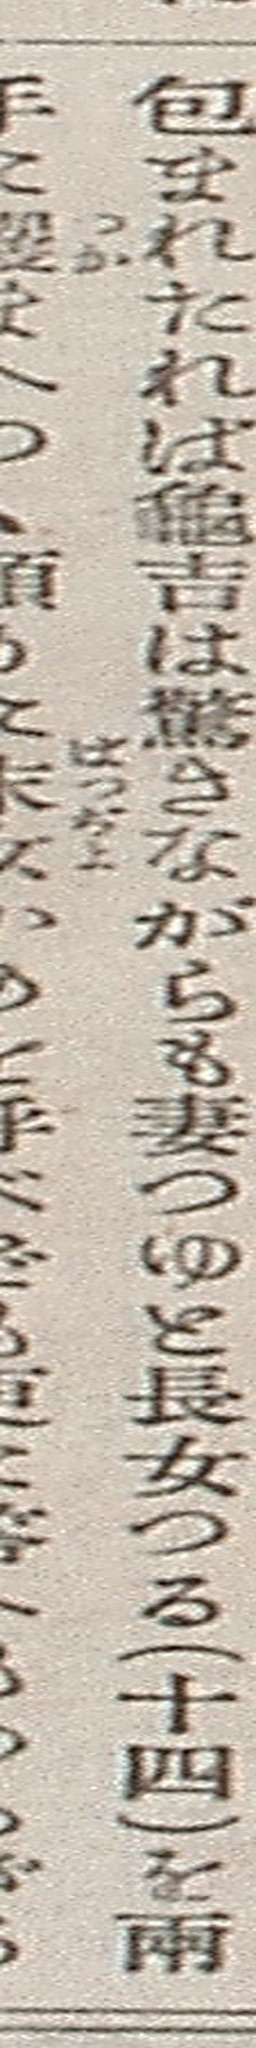手に攫まへつゝ頻りに末女かめを呼べども更に答へもあらざる
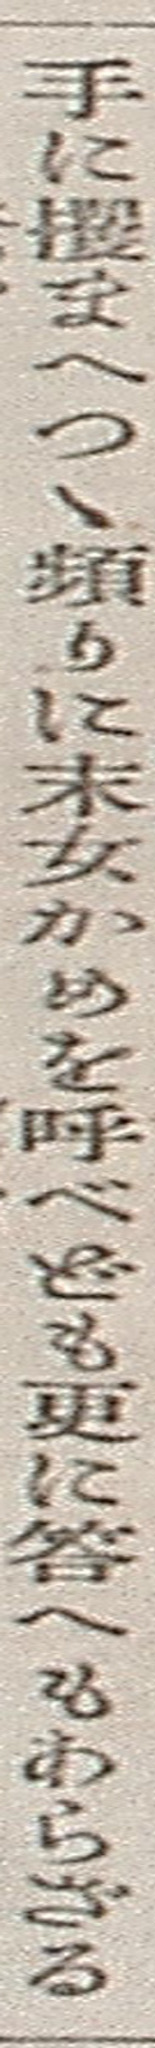手に攫まへつゝ頻りに末女かめを呼べども更に答へもあらざる
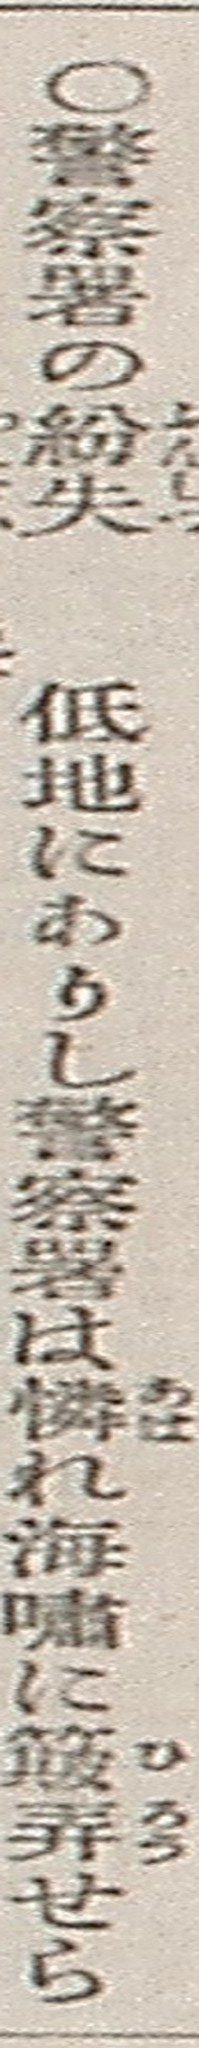○警察署の紛失低地にありし警察署は憐れ海嘯に簸弄せら
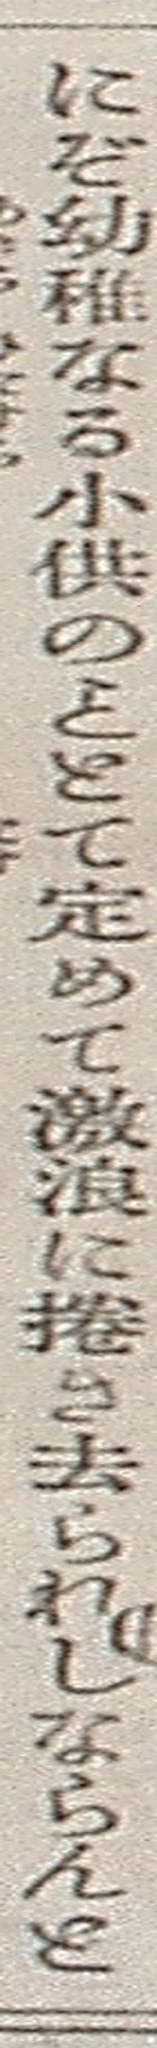にぞ幼稚なる小供のこととて定めて激浪に捲き去られしならんと
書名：風俗畫報臨時増刊第百十九號　大海嘯被害録（中）
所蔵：東京大学地震研究所図書室 Earthquake Research Institute Library, The University of Tokyo, JAPAN
